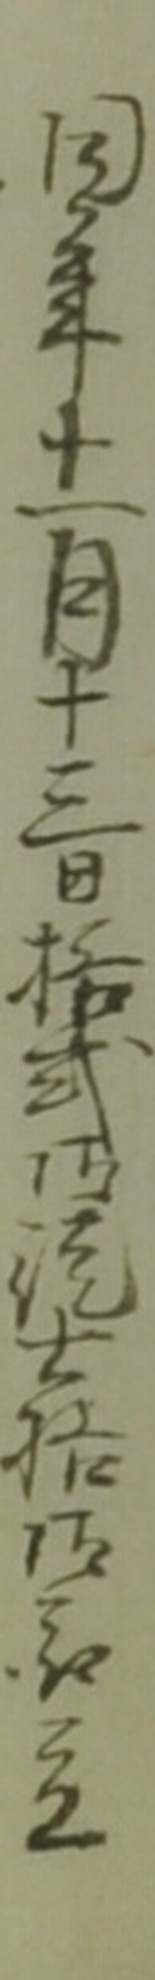一同年十一月十三日格式御徒士格御取立

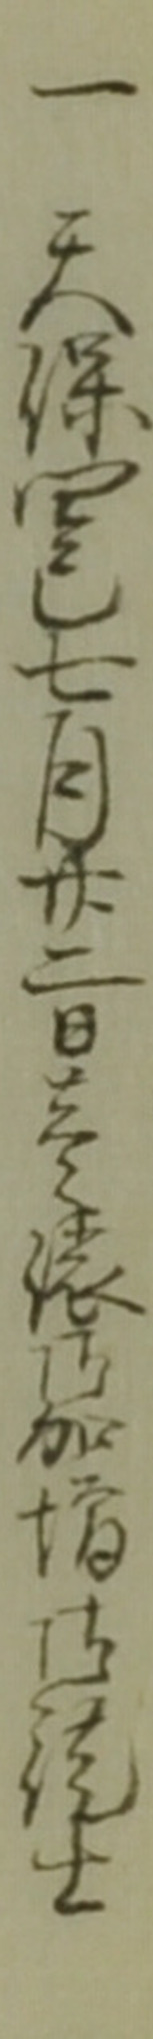一天保四巳七月廿二日壱俵御加増御徒士
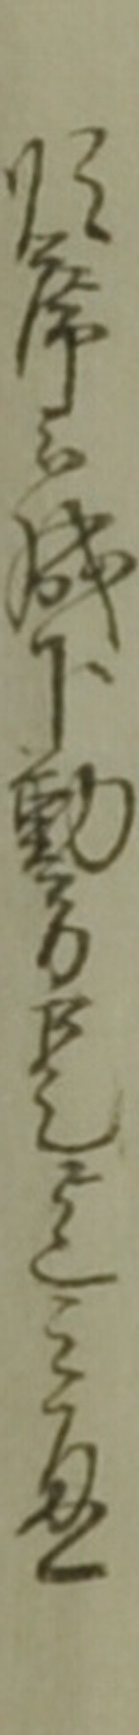順席被成下勤方是迄之通
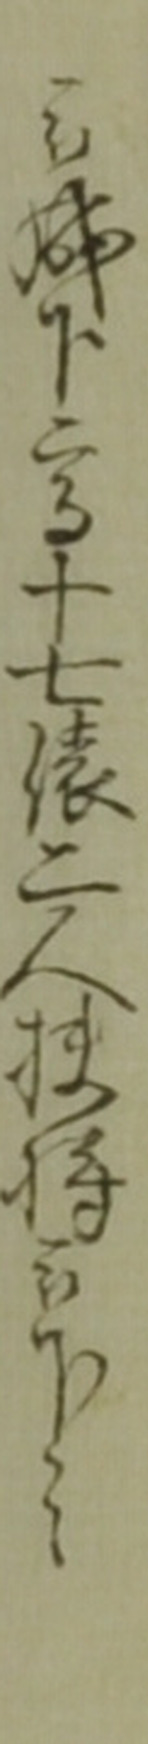被成下高十七俵二人扶持被下之
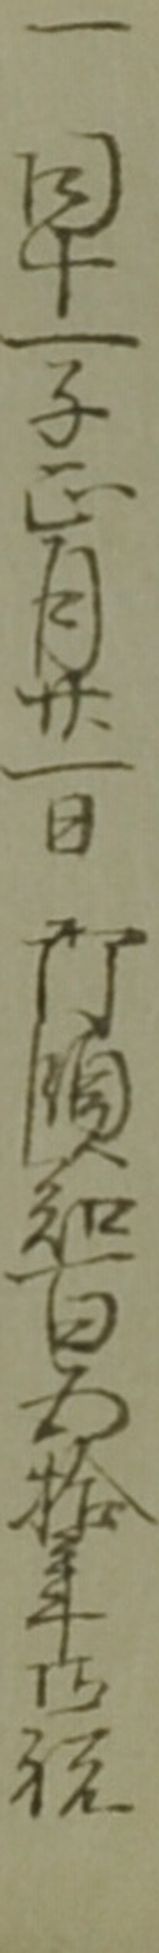一同十一子正月廿一日御領知百五拾年御祝
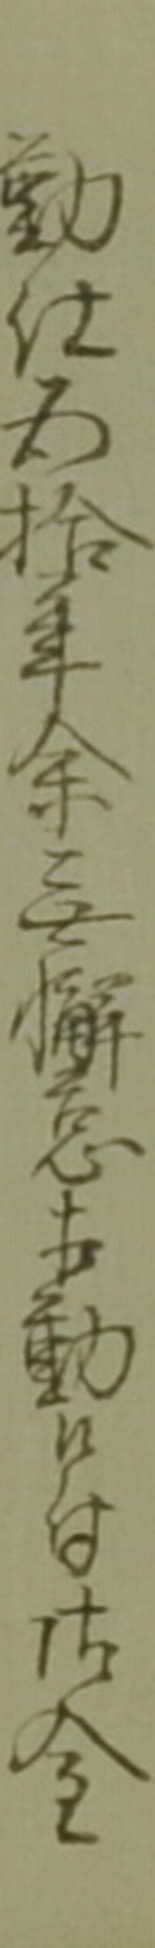勤仕五拾年余無懈怠相勤候付御金
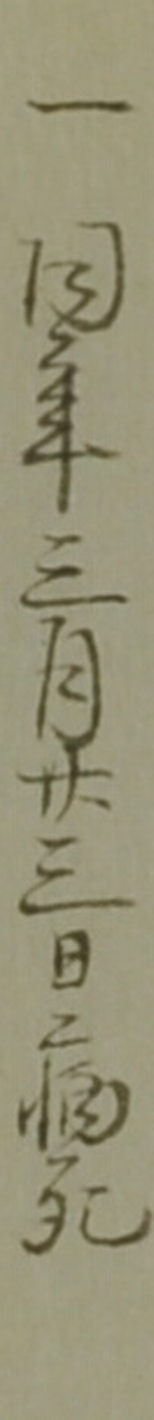一同年三月廿三日病死
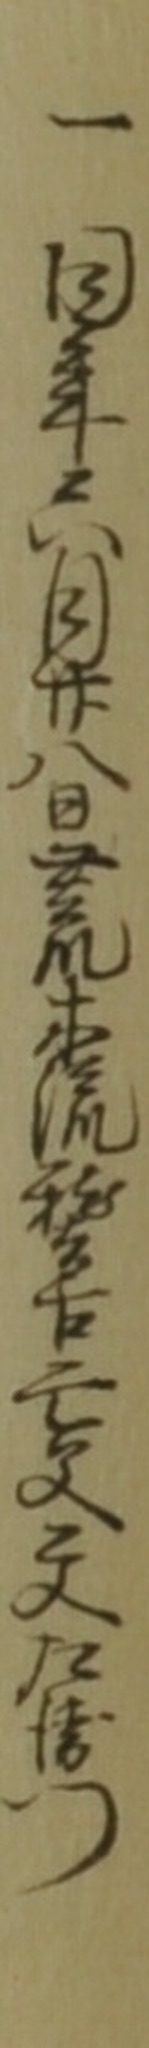一同年六月廿八日荒木流稽古亡父文左衛門
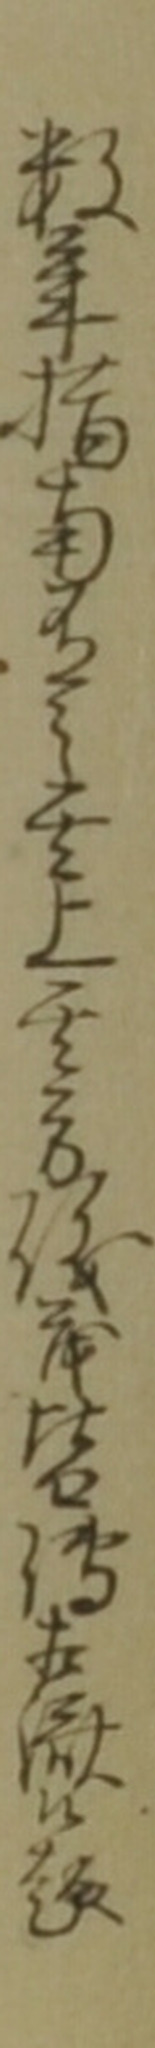数年指南有之其上其方儀茂皆伝相済候趣
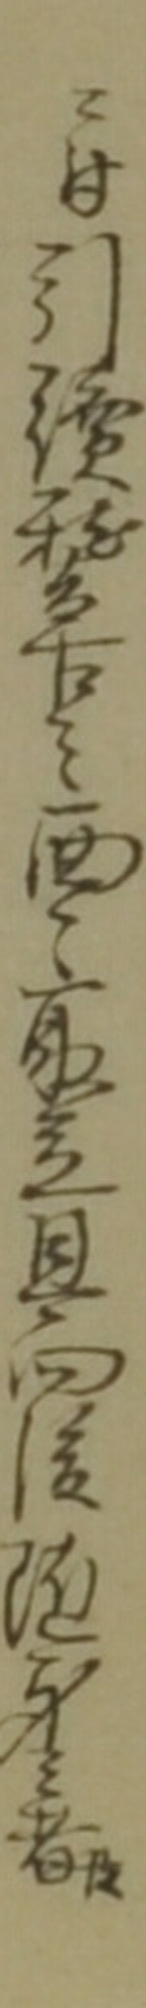ニ付引続稽古之面々取立且向後随身之者共
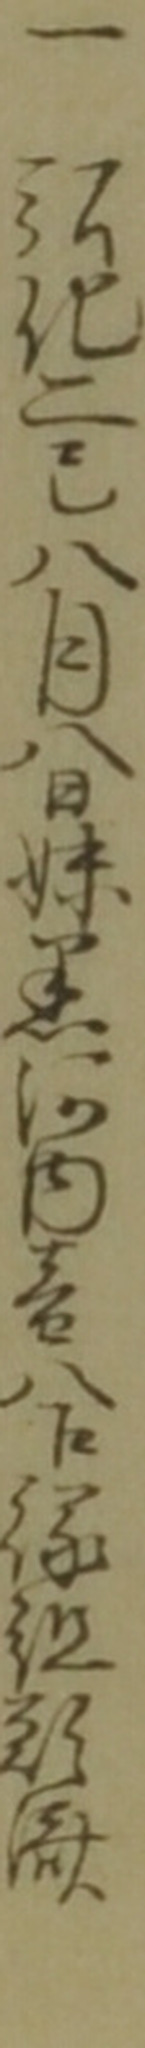一弘化二巳八月八日妹黒河内音八江縁組願済
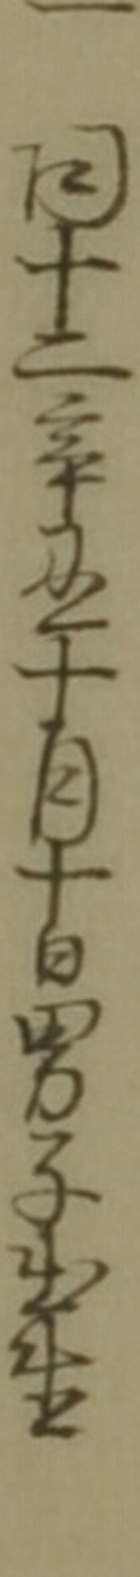一同十二辛丑十月十日男子出生
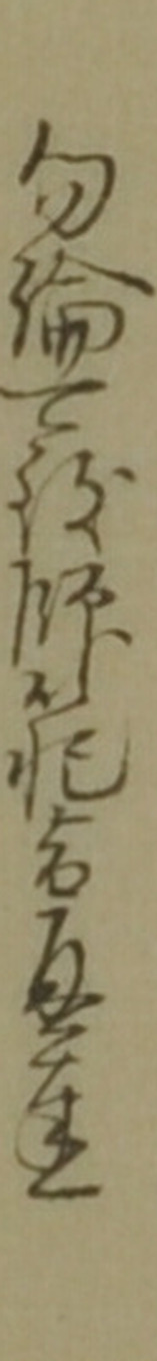勿論可致師範旨通達

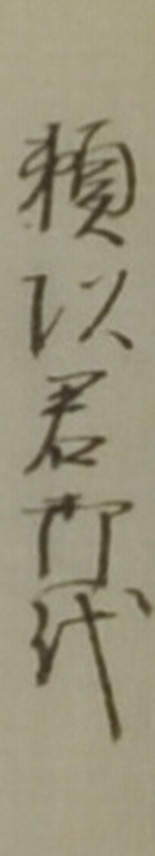頼以君御代
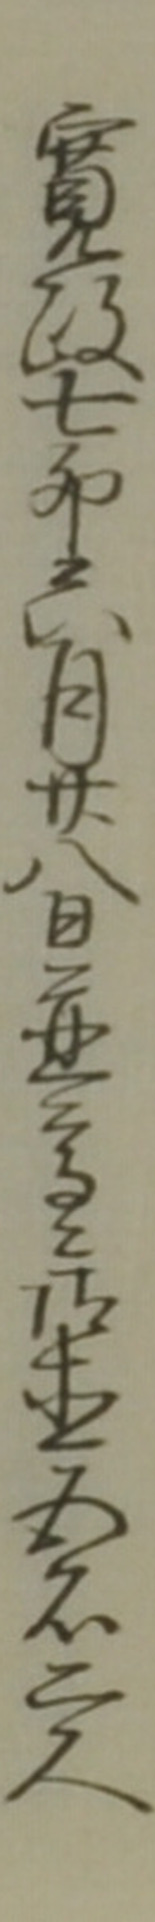一寛政七卯六月廿八日並高ニ御直五石二人
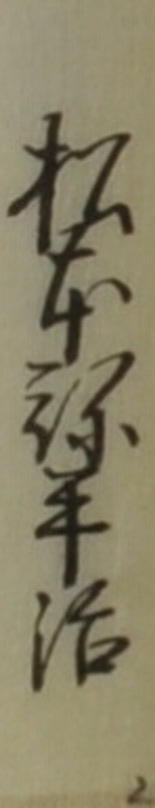松本弥平治
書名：無足諸士勤仕録（七）
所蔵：伊那市立高遠町図書館・合同会社AMANE
